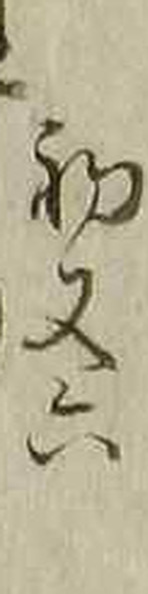初又六
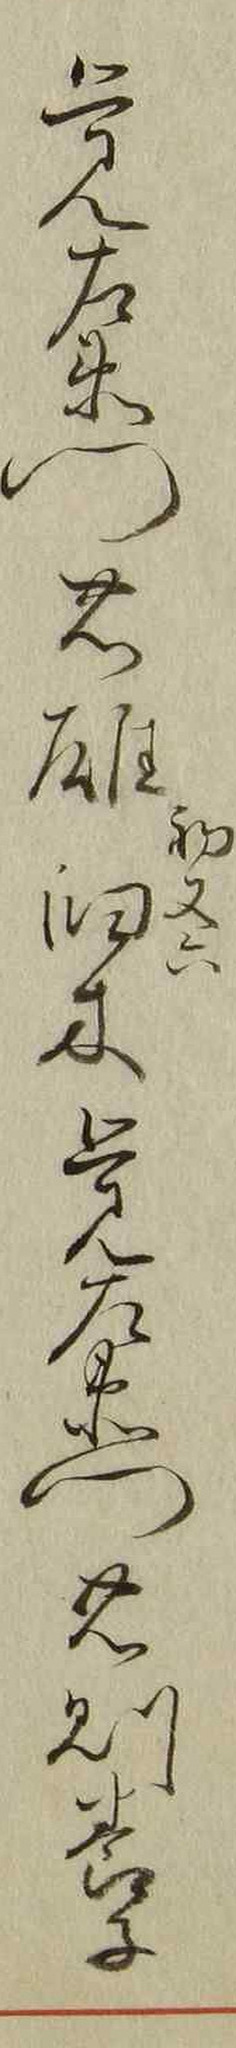覚右衛門忠雄臼木覚左衛門忠則養子
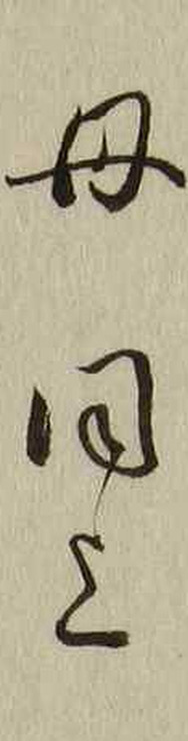母同上
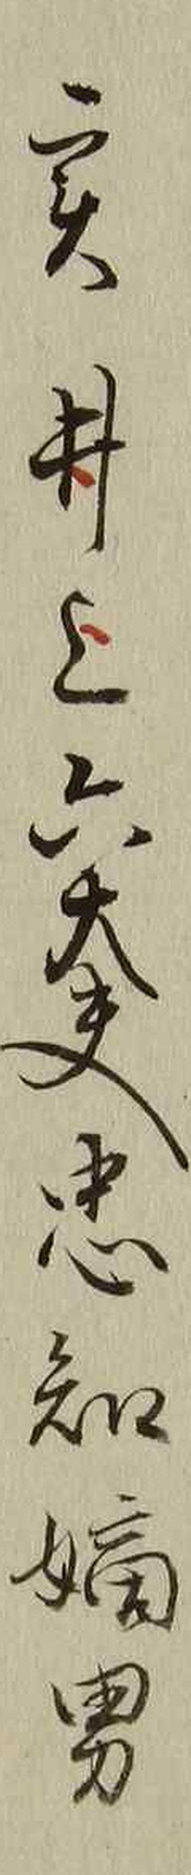実井上六大夫忠知嫡男
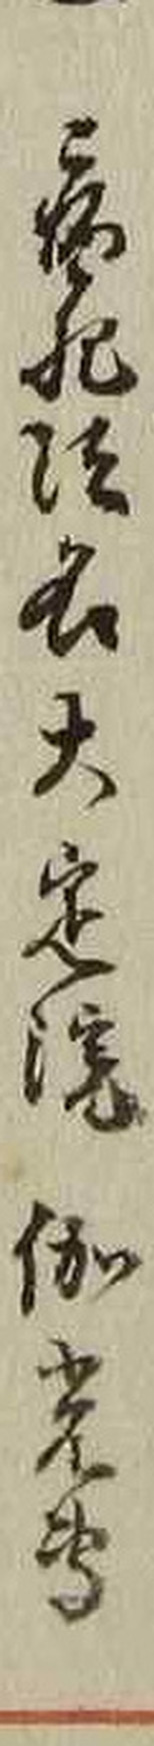病死法名大定院伽光専
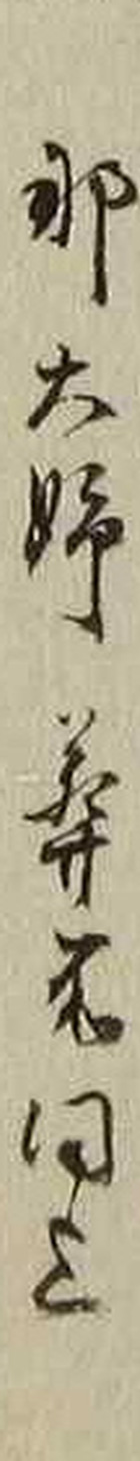那大姉葬所同上
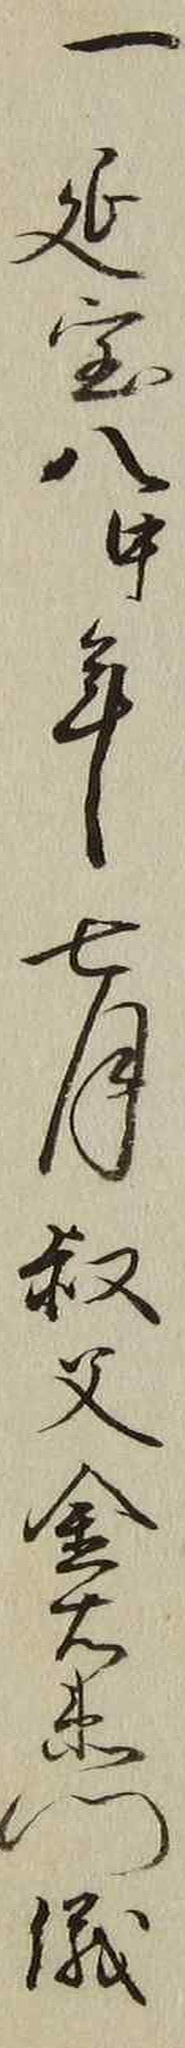一延宝八申年七月叔父金右衛門儀
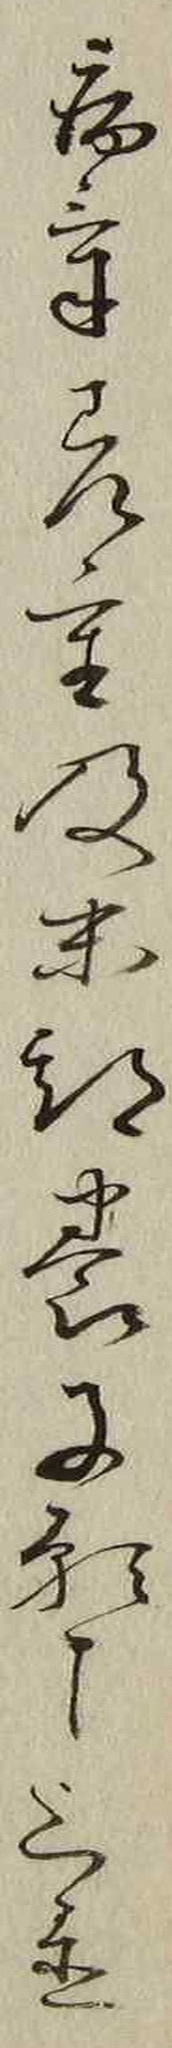病気差重及末期養子願申上置
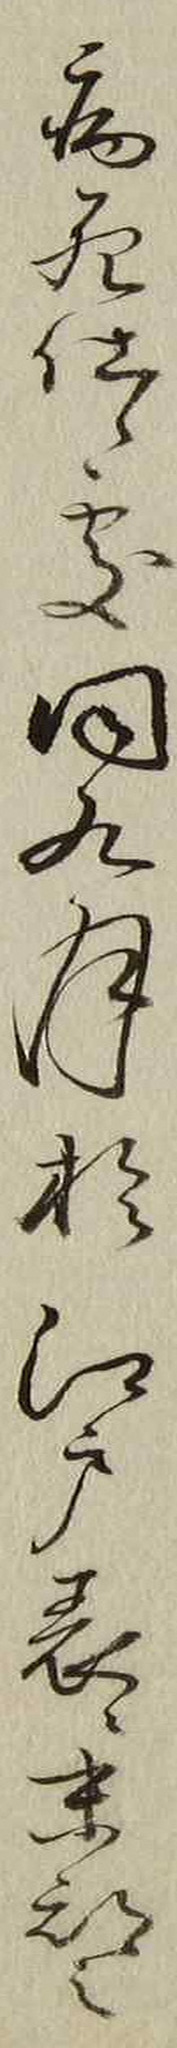病死仕候処同九月於江戸表ニ末期之
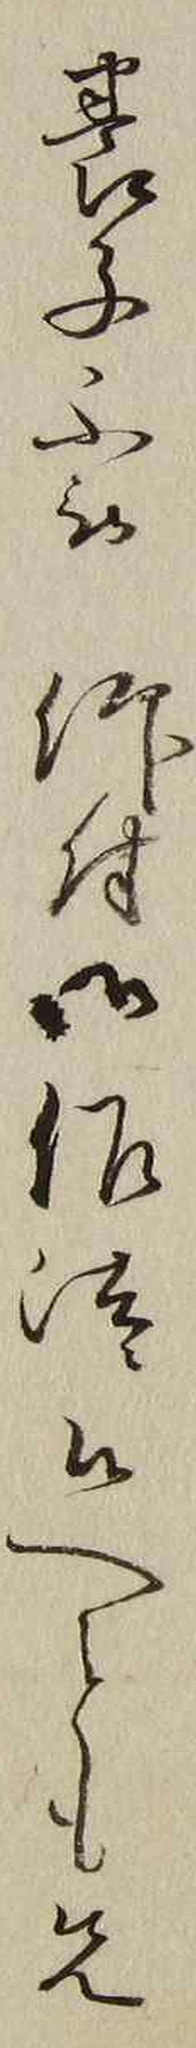養子不被仰付御作法ニ候へとも先
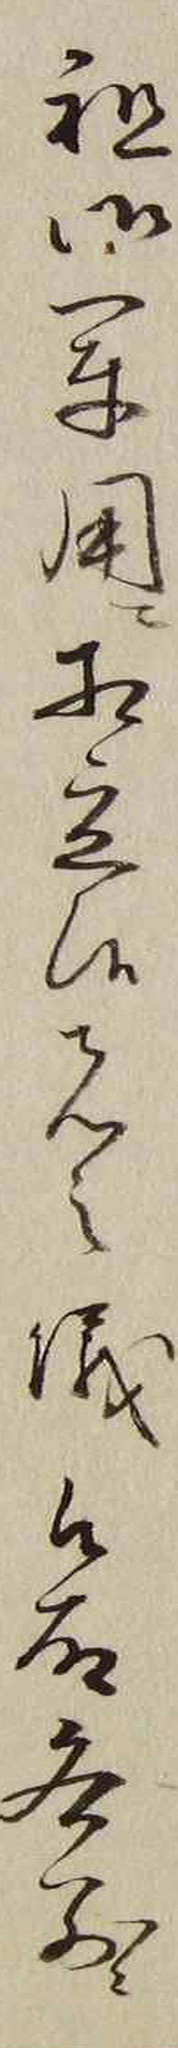祖御軍用ニ相立候者之儀候故各別ニ
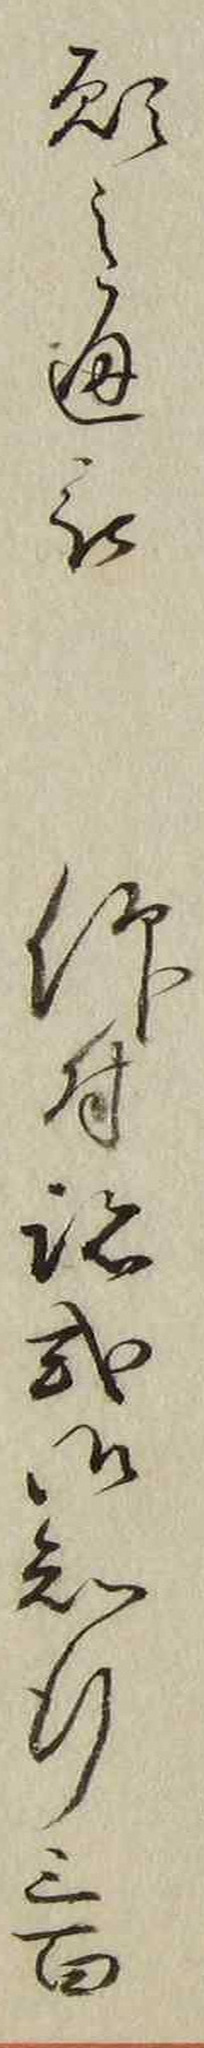願之通被仰付跡式御知行三百
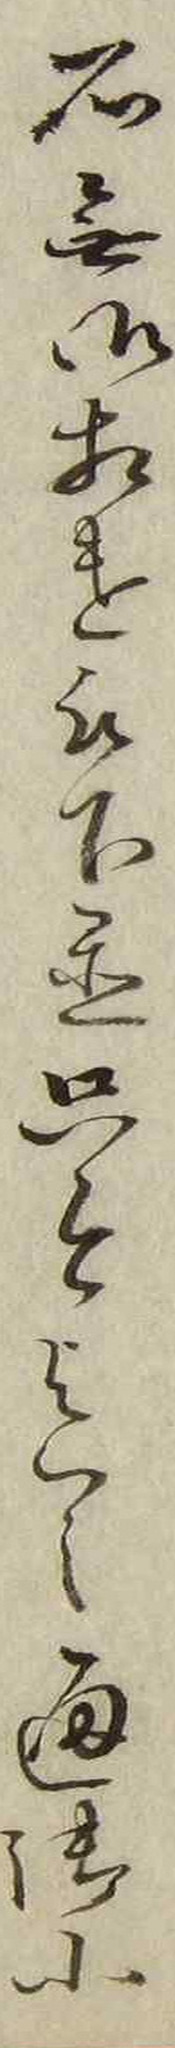石無御相違被下置只今迄之通御小

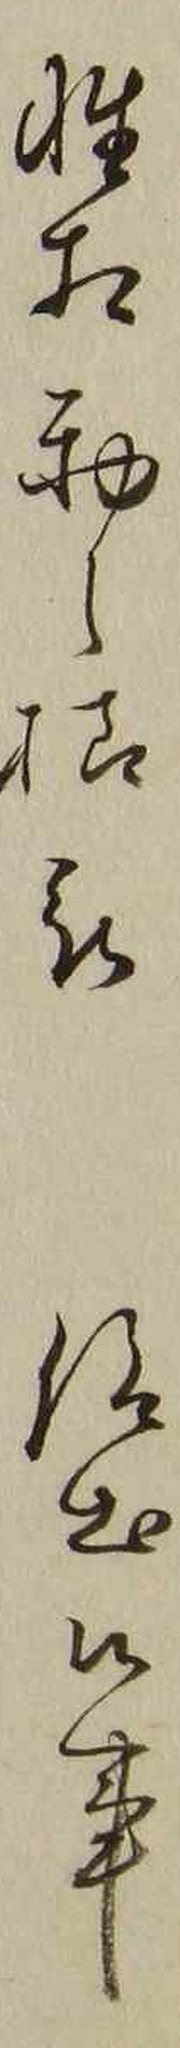性相勤候様被仰出候事
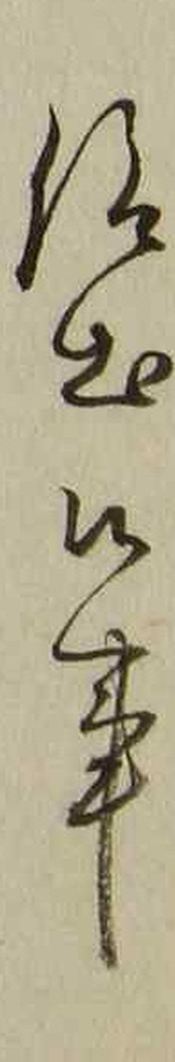仰出候事
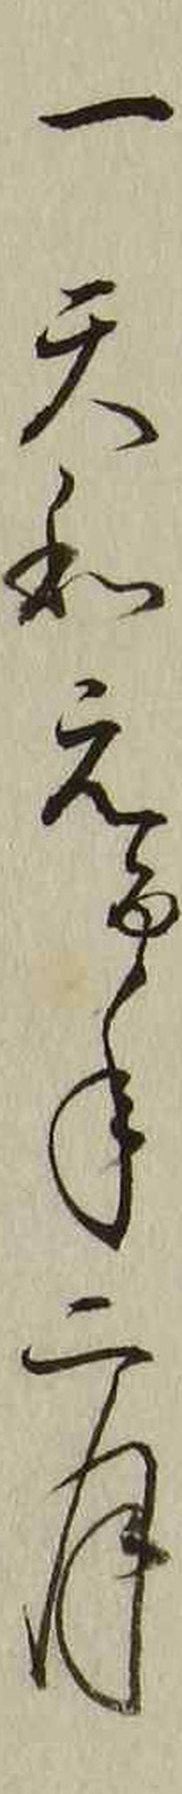一天和元酉年二月
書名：諸士系譜　巻之2　い之部2
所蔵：会津若松市立会津図書館
